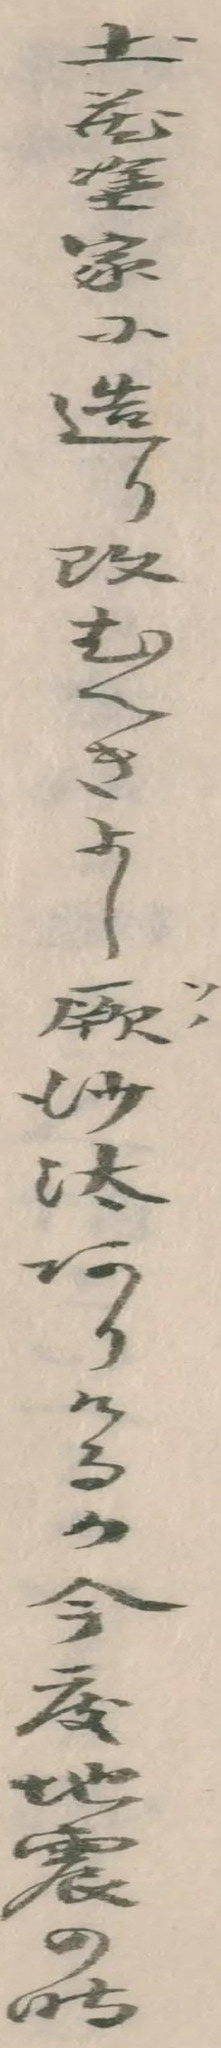土蔵塗家に造り改むへきよし厥沙汰ありけるか今度地震の時
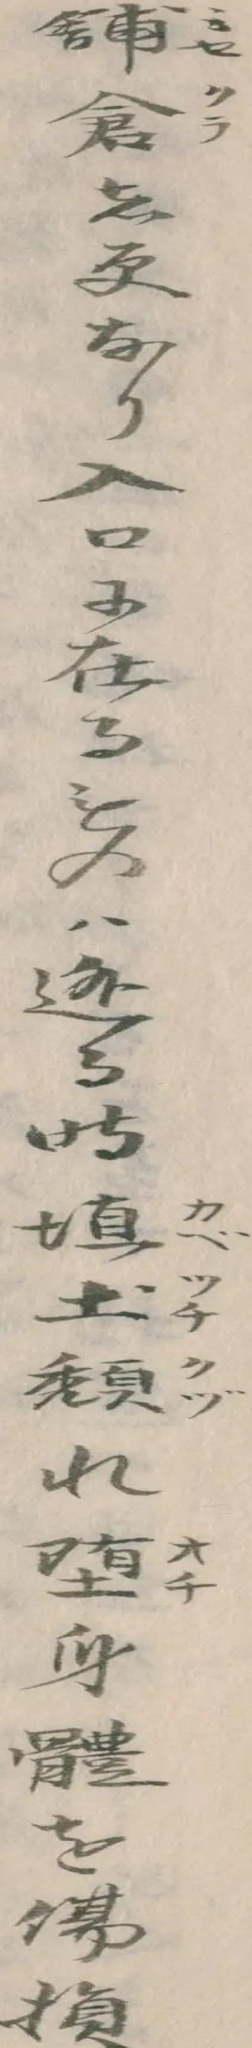舗倉は更なり入口に在るものは逃る時埴土頽れ堕身体を傷損
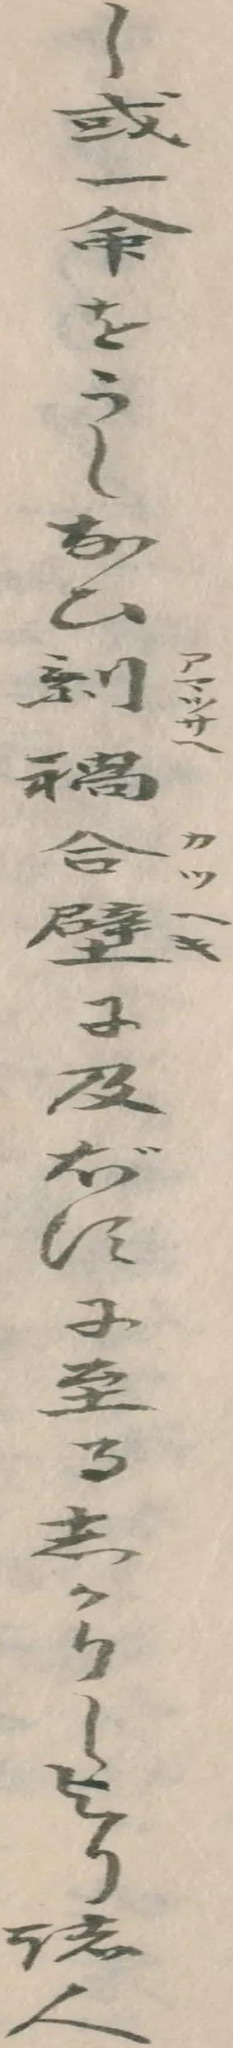し或一命をうしなひ剰禍合壁に及ぼすに至るしかりしより諸人
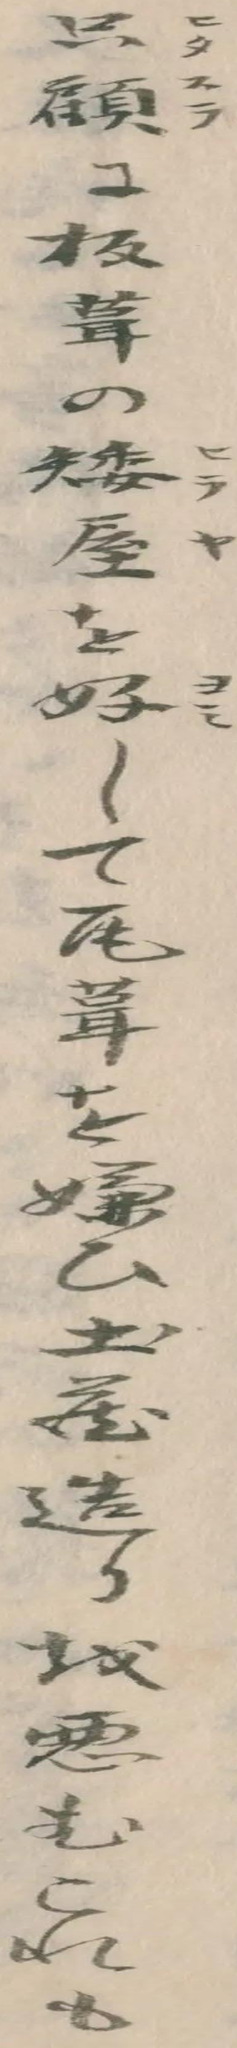只顧に板葺の矮屋を好して瓦葺を嫌ひ土蔵造りを悪むこれも

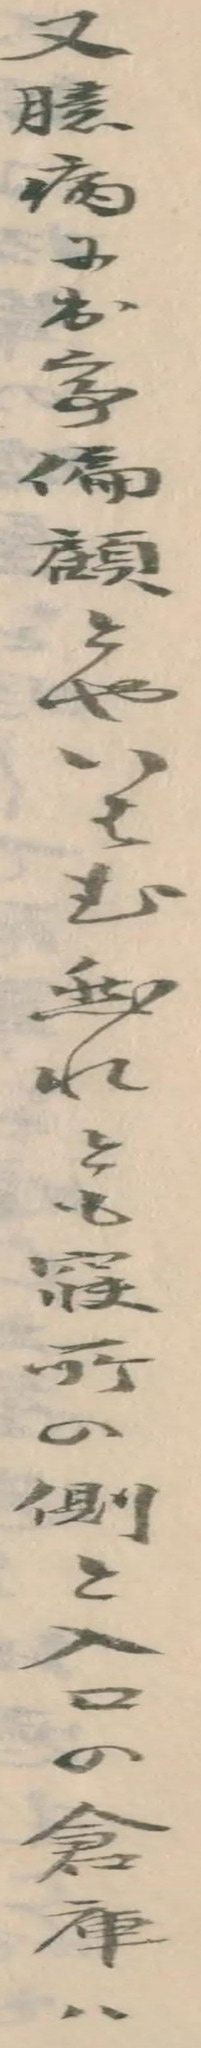又臆病に出て偏顧とやいはむ然れとも寐所の側と入口の倉庫は
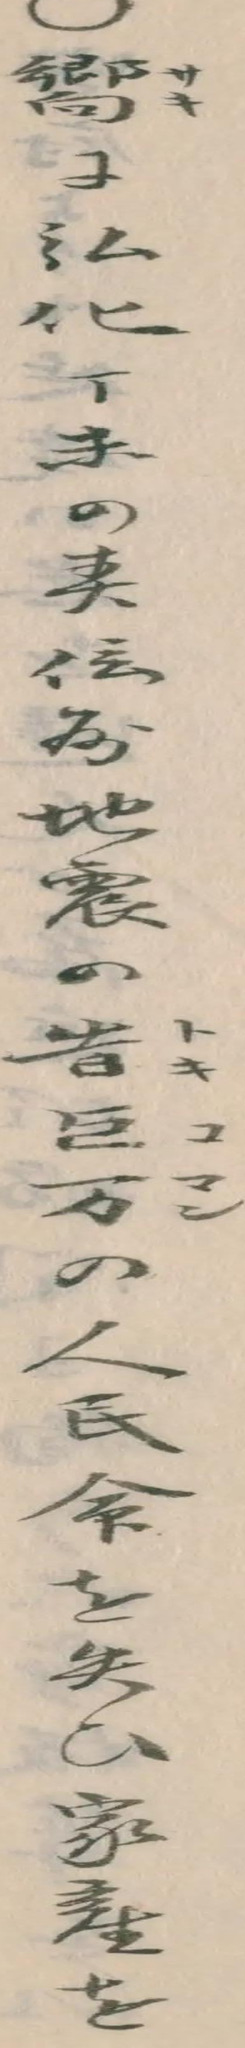〇嚮に弘化丁未の春信州地震の旹巨万の人民命を失ひ家産を
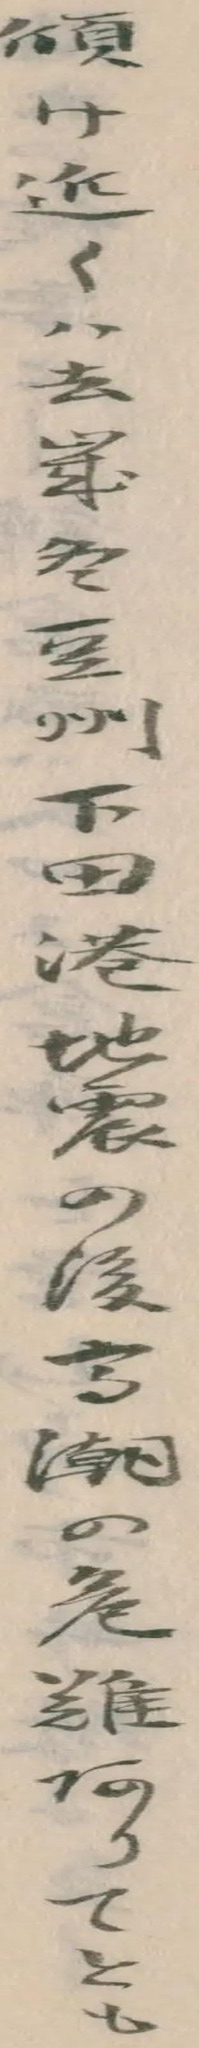傾け近くは去歳冬豆州下田港地震の後高潮の危難ありてとも
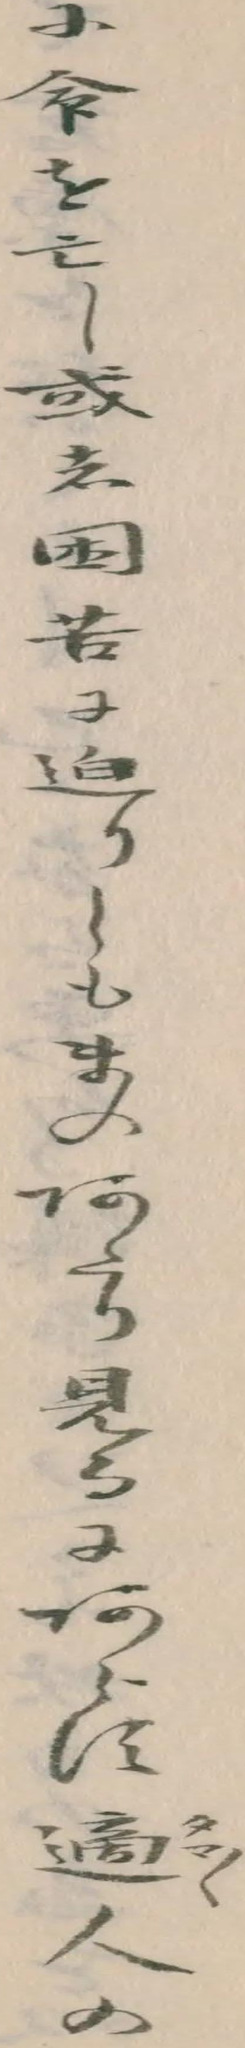に命を亡し或は困苦に迫りしもまのあたり見るにあらす適人の
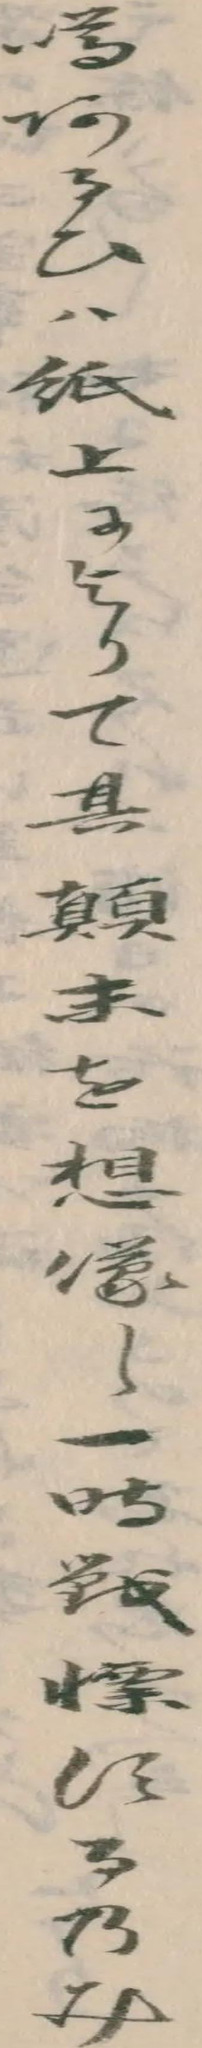噂あるひは紙上によりて其顛末を想像し一時戦慄するのみ
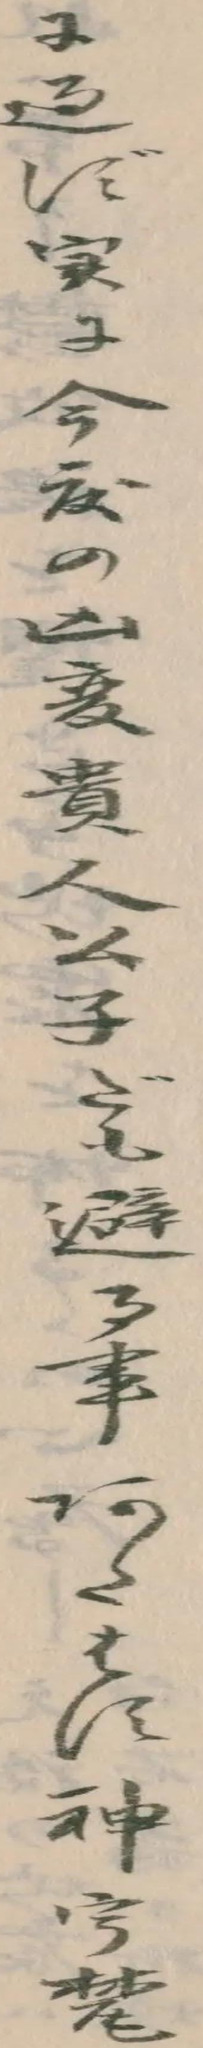に過ず実に今度の凶変貴人公子ども避る事あたはす神宇梵
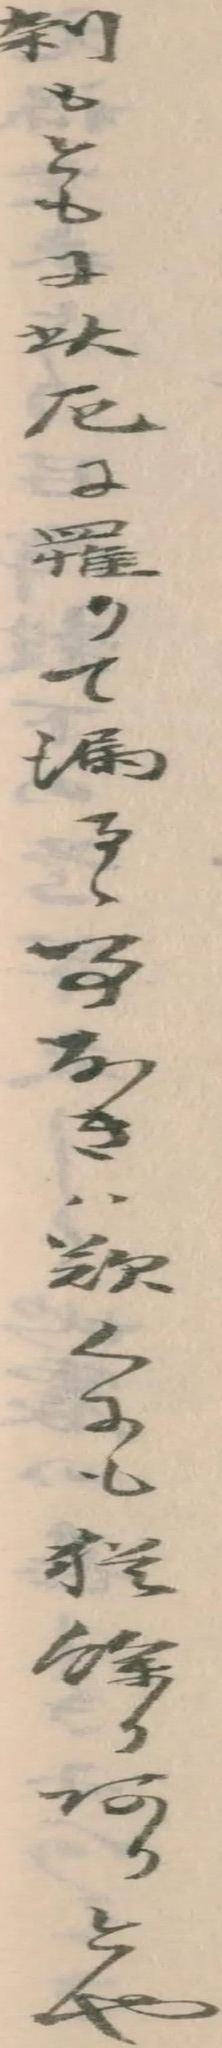刹もともに此厄に罹りて漏るゝ事なきは歎くにも猶余りありとや
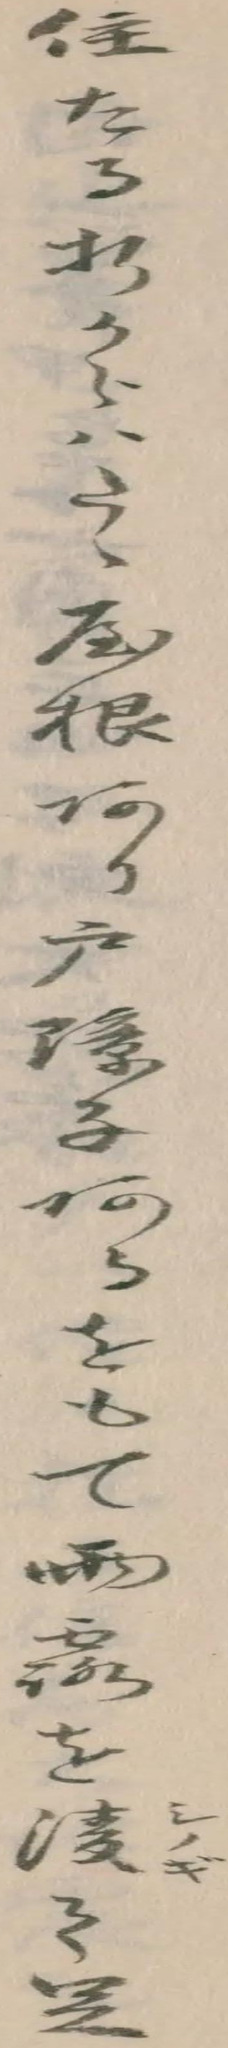住たる折からはたゝ屋根あり戸障子あるをもて雨露を凌て足
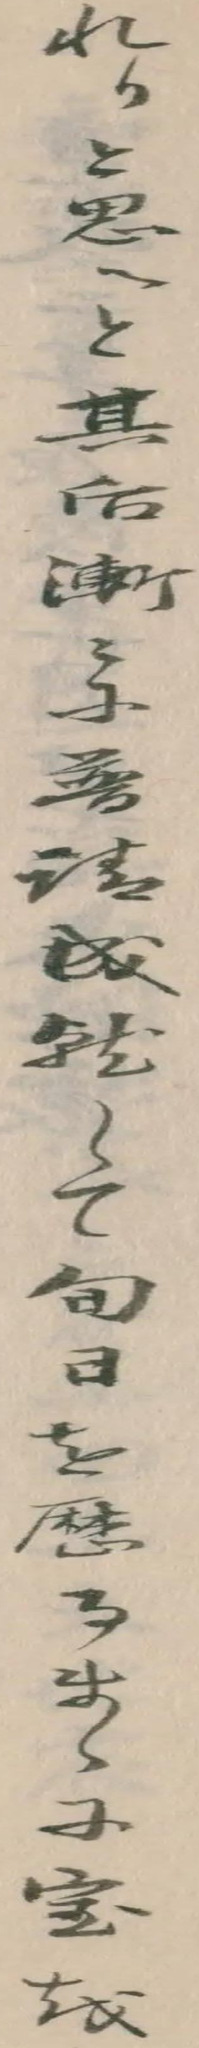れりと思へと其后漸々に普請成就して旬日を歴るまゝに宝を
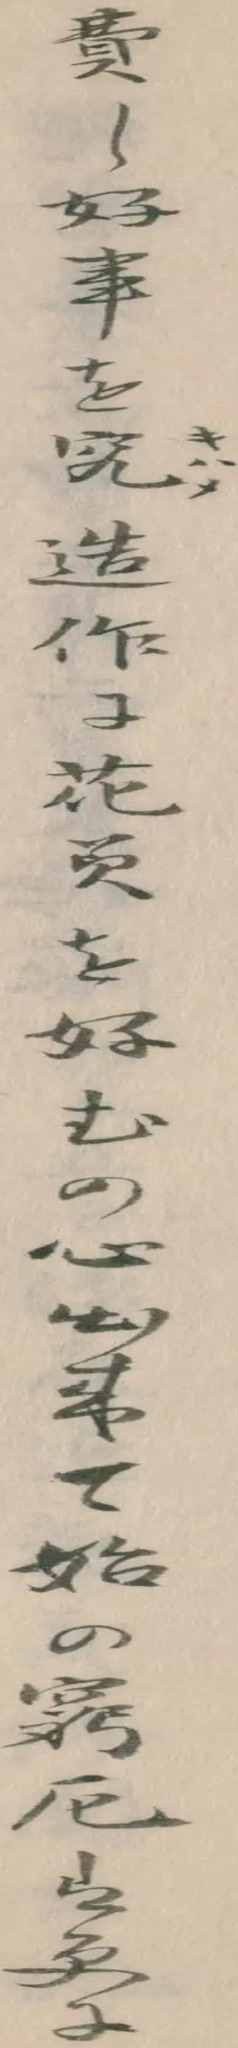費し好事を究造作に花員を好むの心出来て始の窮厄は更に
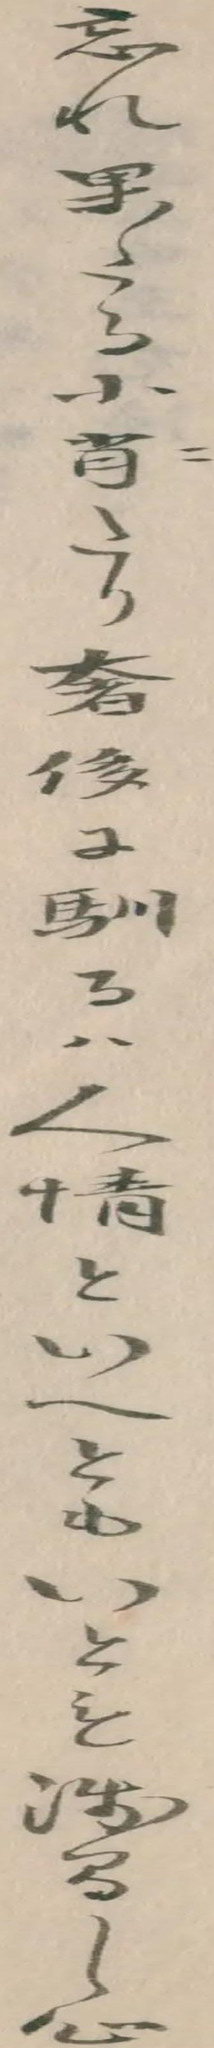忘れ果たるに肖たり奢侈に馴るは人情といへともいとも浅まし心
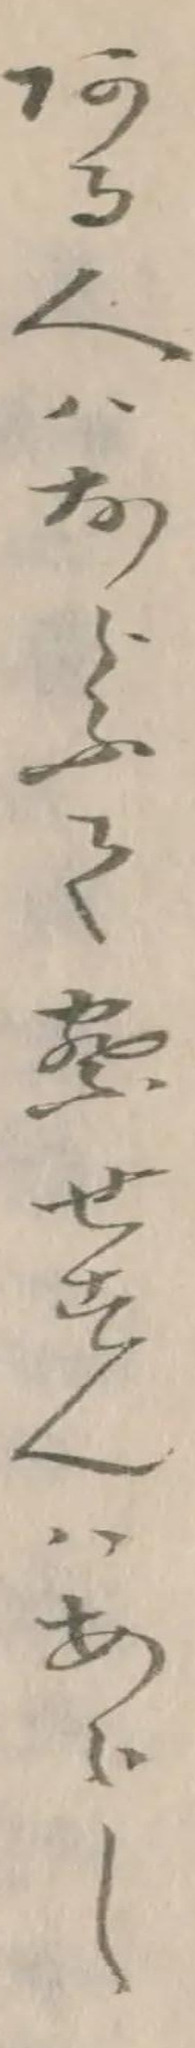ある人はならふて察せすんはあらし
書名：地災撮要. 巻10(地震之部) 上,下
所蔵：国立国会図書館 National Diet Library, JAPAN
